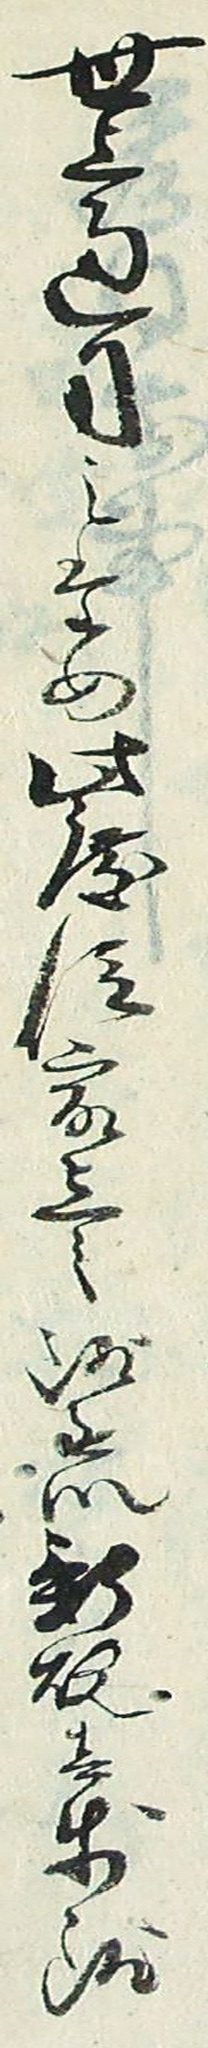世上通用之ため此度位最上之銀を以新規壱歩銀

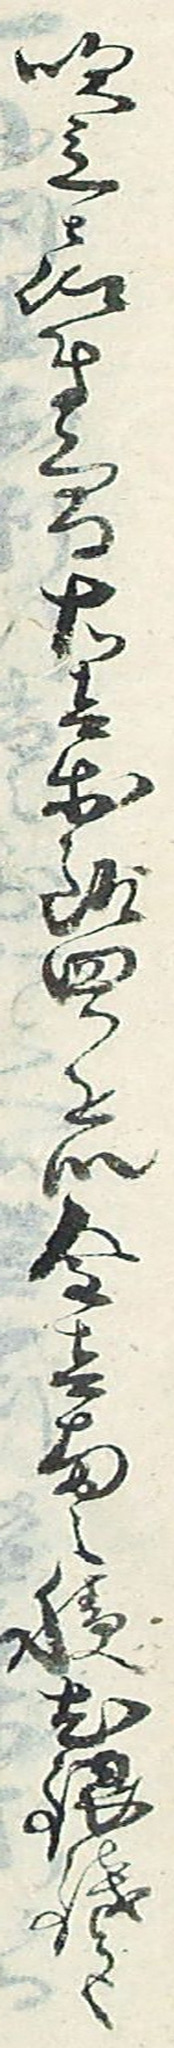吹立被仰付候間右壱歩銀四つを以金壱両之積尤銀銭とも
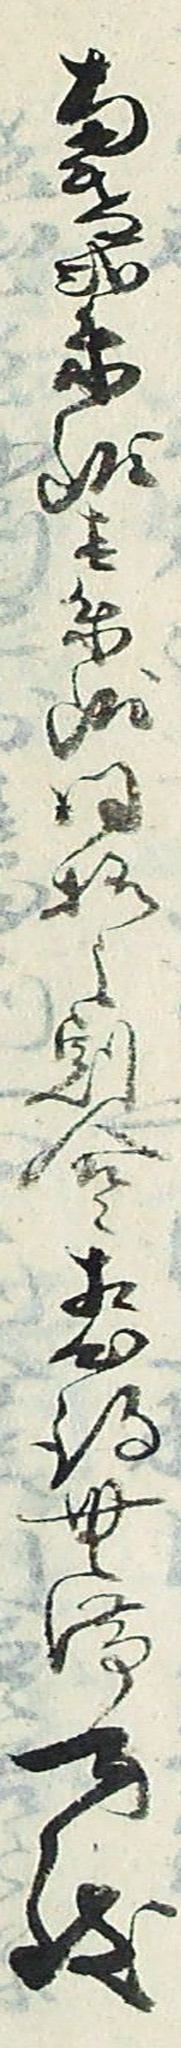両替弐朱銀壱朱銀同様之割合に相心得無滞可致
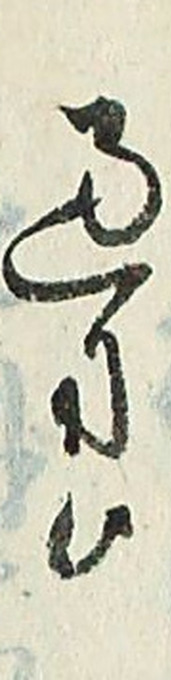通用候
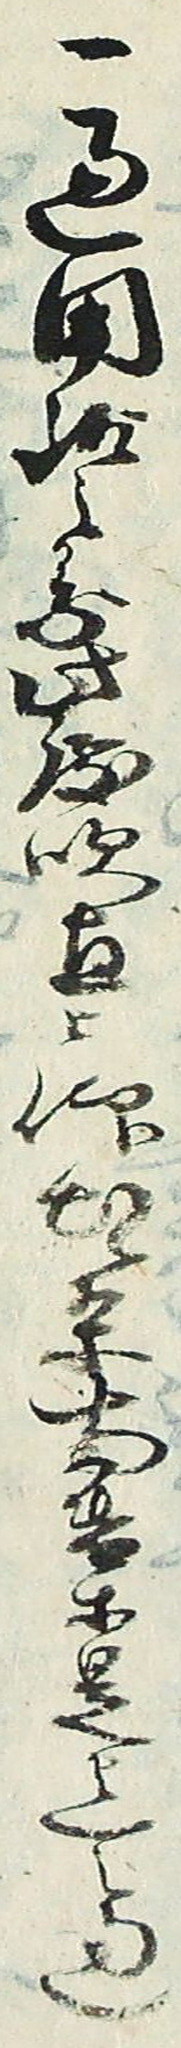一通用銀之義此度吹直被仰出候条両替等是迄之通
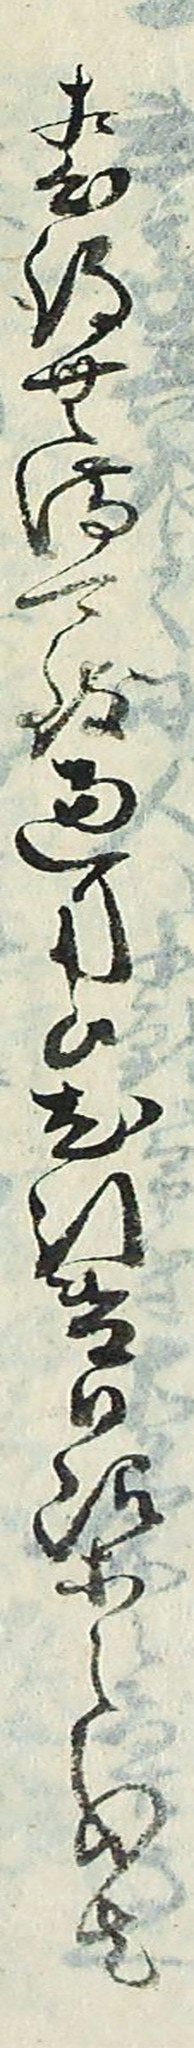相心得無滞可致通用候尤引替日限等之義は
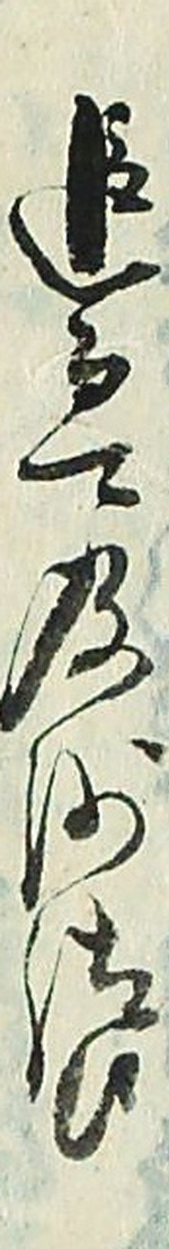追而可及沙汰候
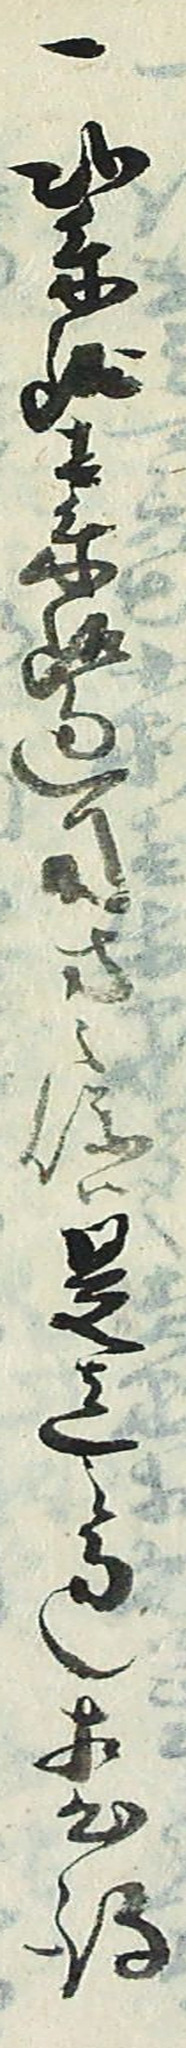一弐朱銀壱朱銀通用方之儀は是迄之通相心得
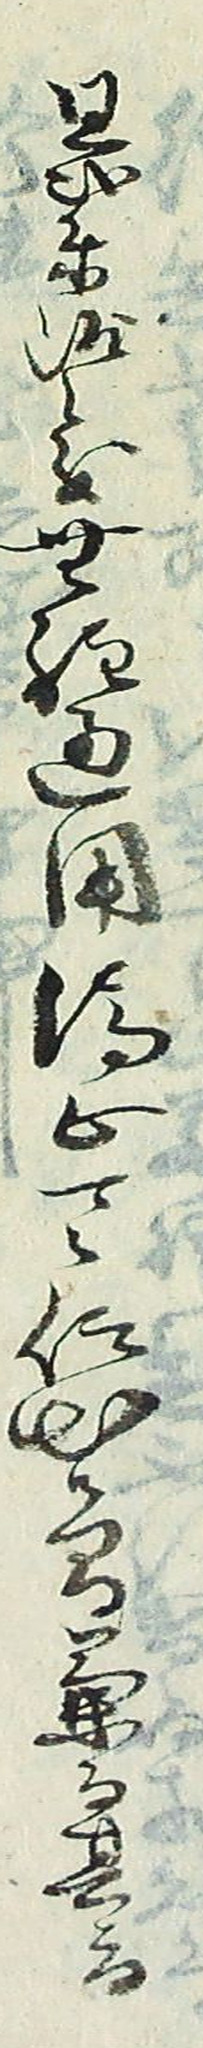且弐朱銀之義無程通用停止可被仰出候間兼而其旨
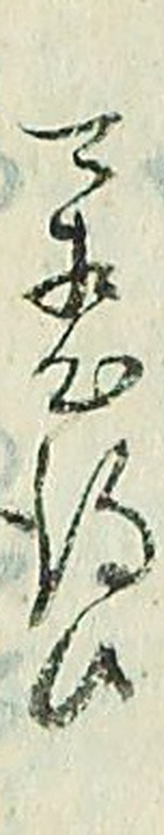可相心得候
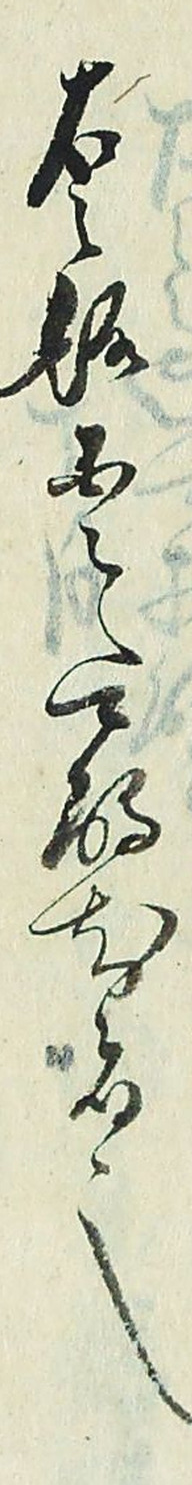右之趣国々へ可触知者也
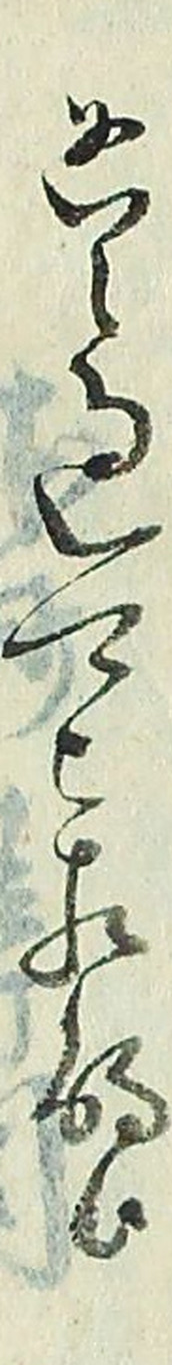右之通可被相触候
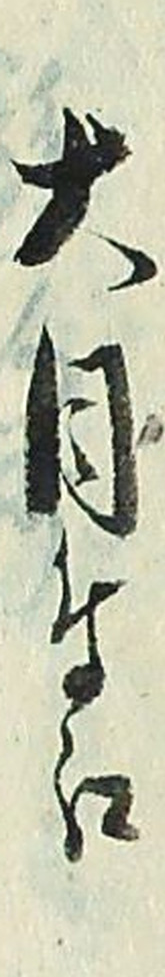大目付江
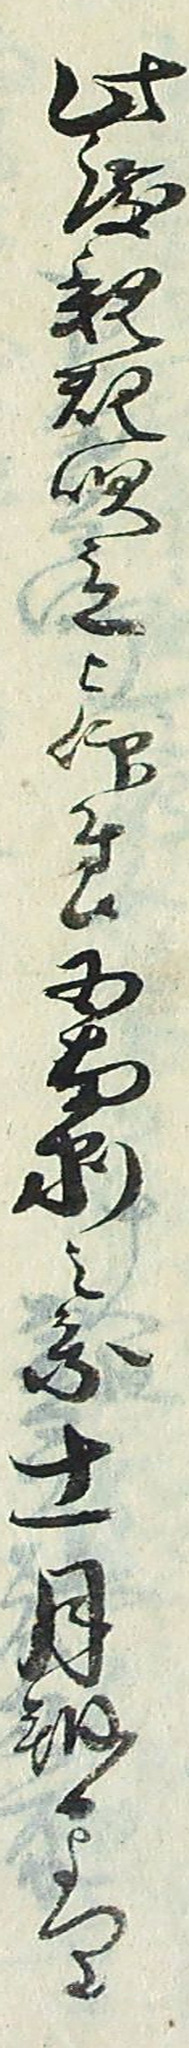此度新規吹立被仰付候五両判之義十一月朔日より
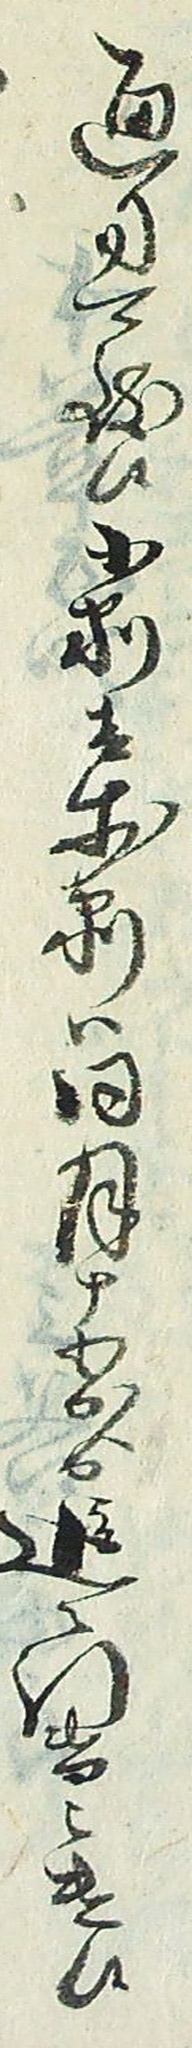通用可致候小判壱歩判は同月十五日ゟ追々引替被遣候
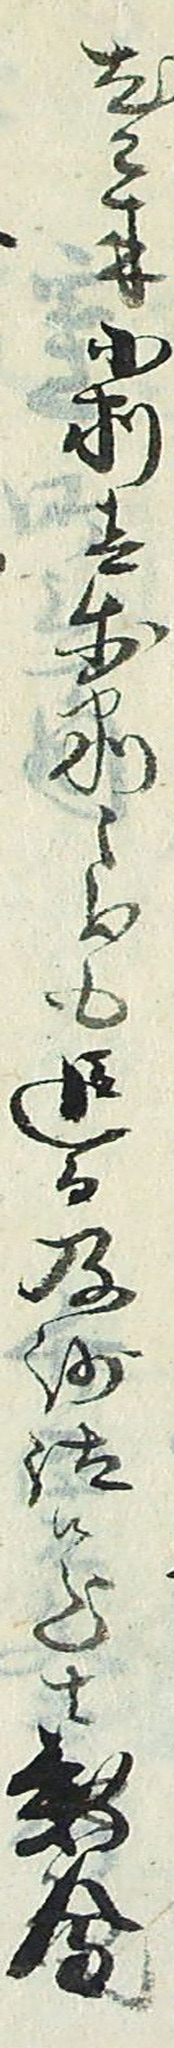尤已来小判壱歩判之義も追て及沙汰候迄は新金
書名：諸御用御□受書控
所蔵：鳴門教育大学 Naruto University of Education
